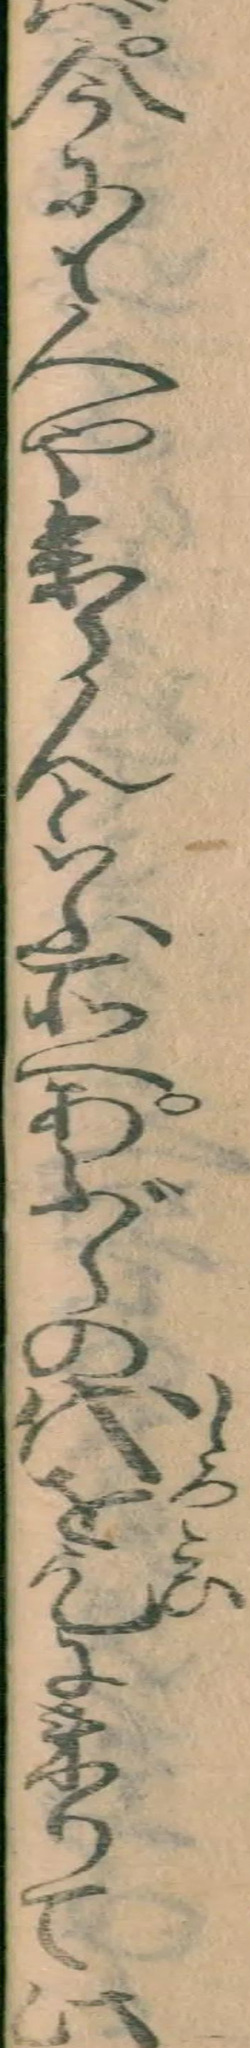ば。今にも人や参らんといふ所へ。あぶらの代を乞に来りて此
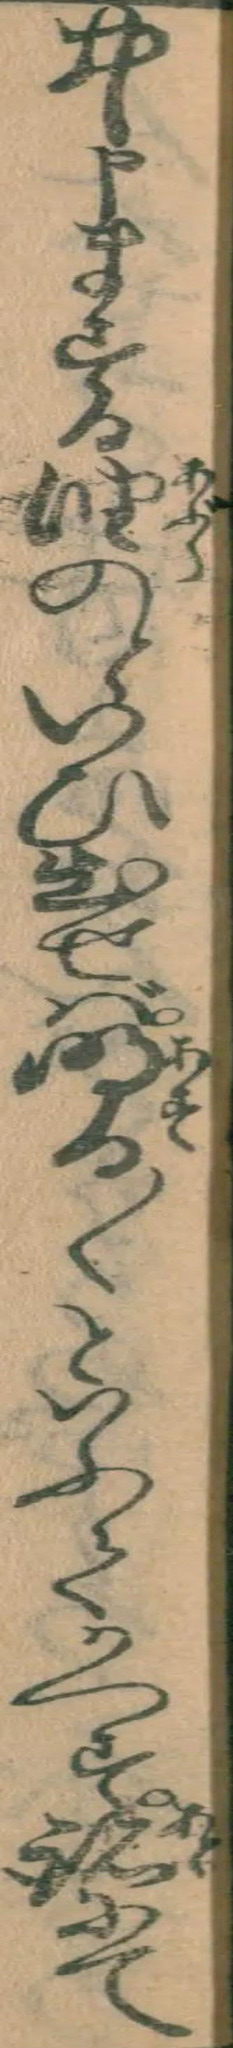中申まする油のといひ出せば。明日〳〵といふてかへす。跡にて
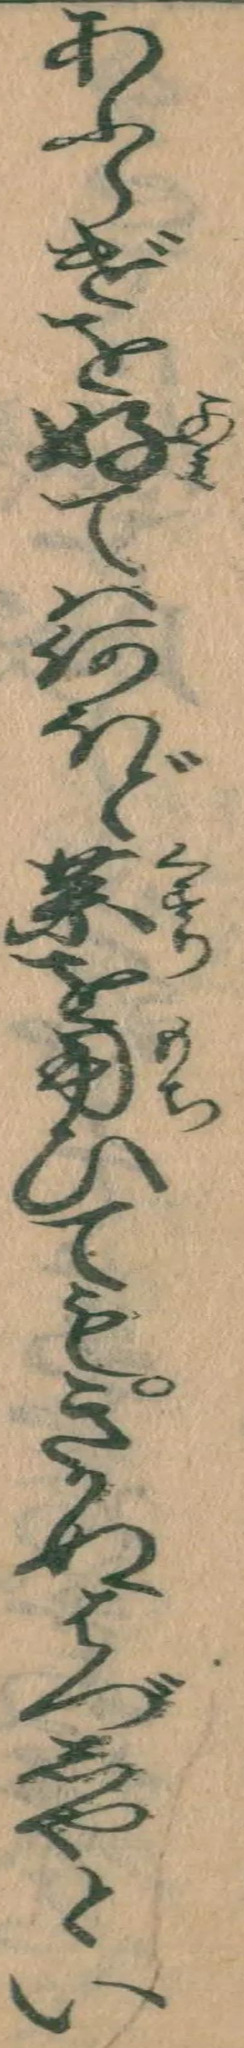あふらげを好ては何ほど薬を用ひても。きかぬはづしやとい
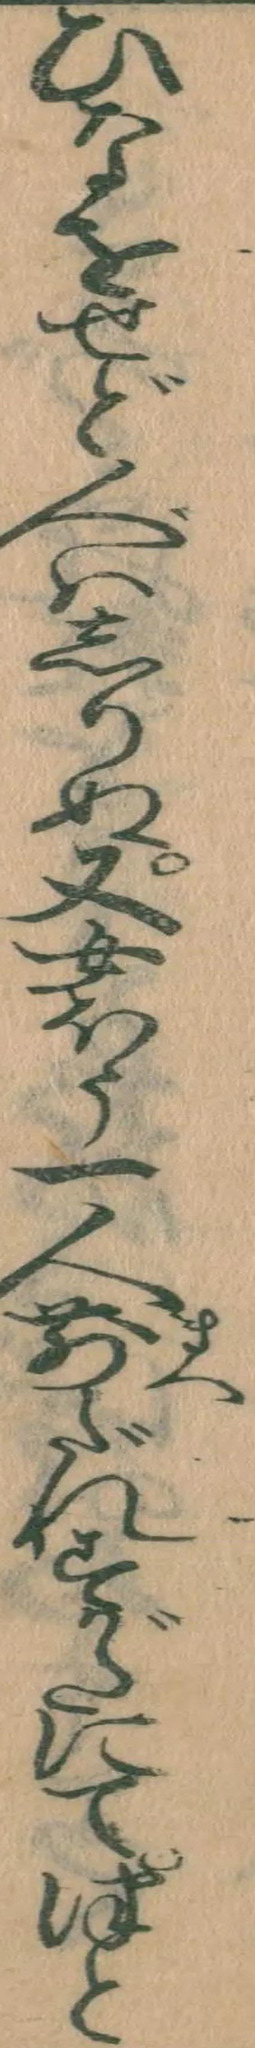ひなをせど人はしりぬ。又女ほう一人前だれすがたにて。つと
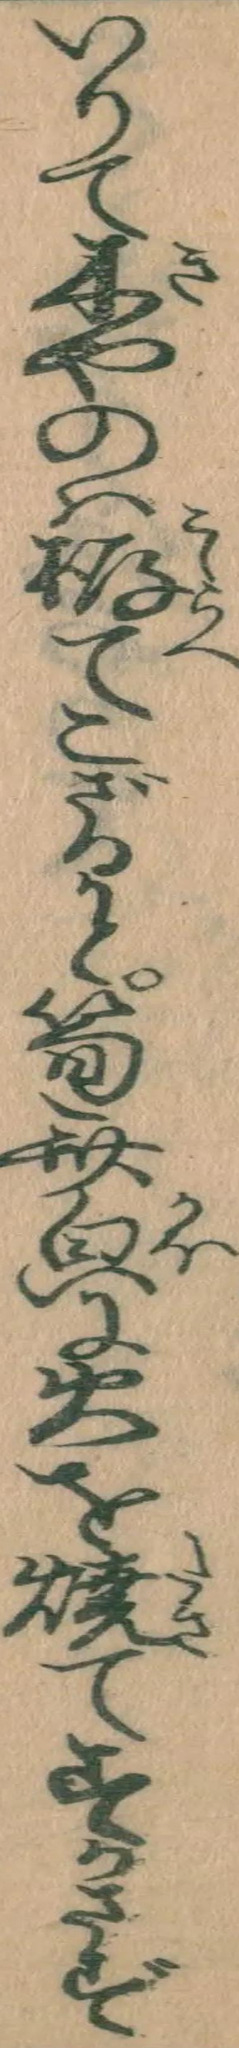いりて木やのは拵てこざるかと。筍斎貌に火を焼てすかさず
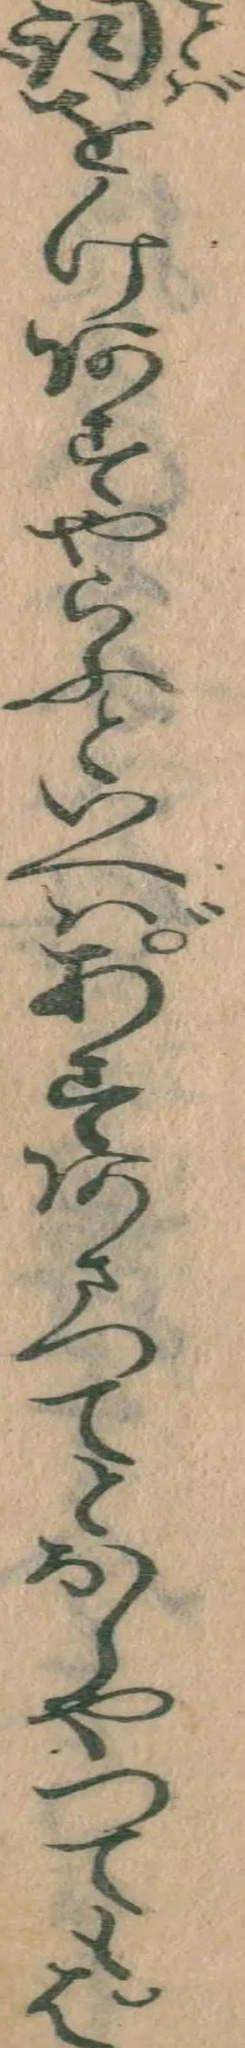詞をけあすやらふといへば。あすあさつてとおしやつても。は
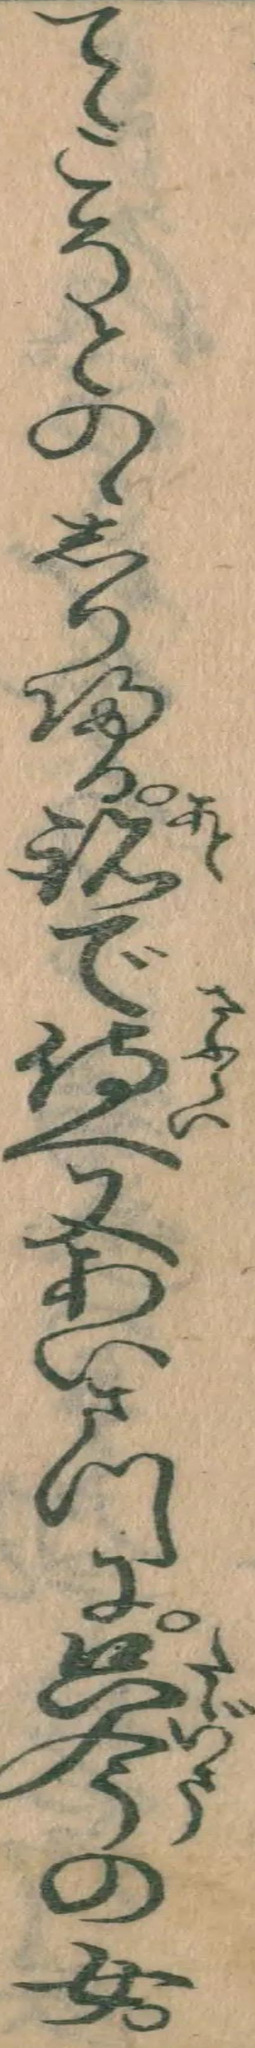てゝこそとのゝしり帰る。跡で侍へ又あいさつに。只今の女
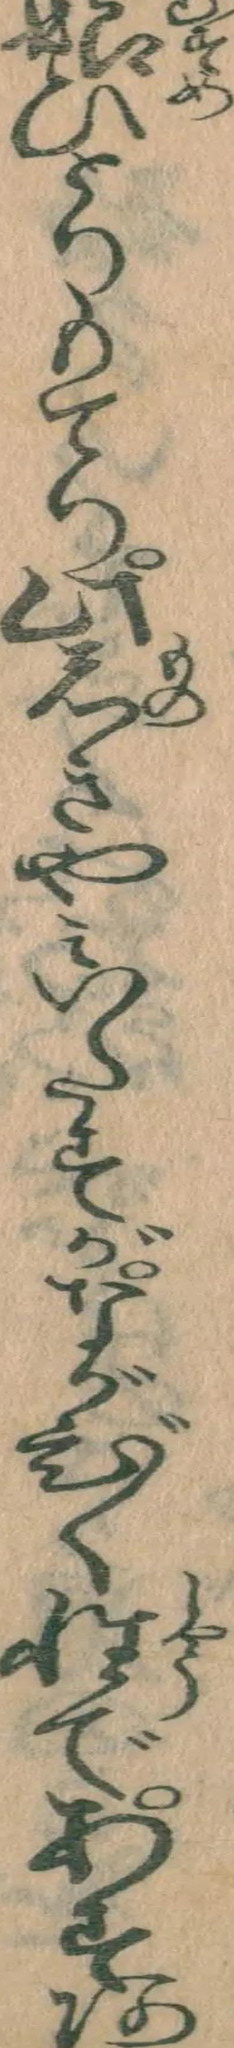娘ひとりもてり。此者きやみいたすが。ながび〱性で。あすあ
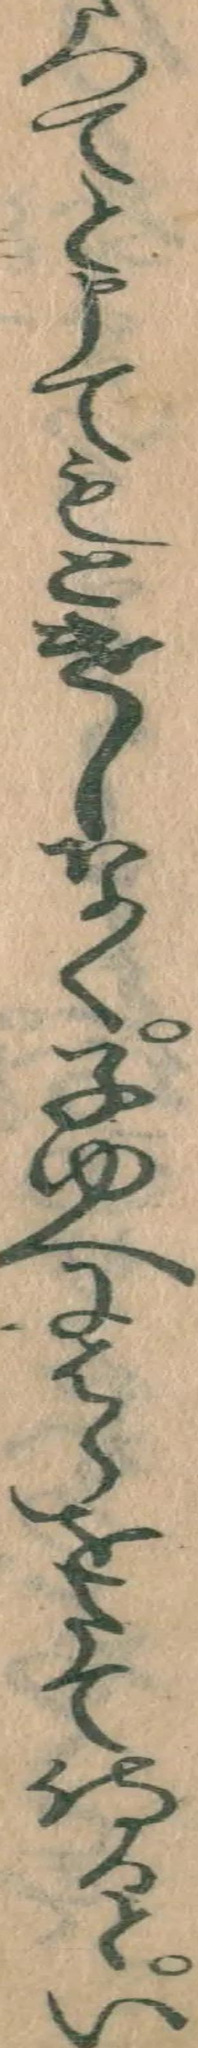さつてと申てもとけしなく。子ゆへにはらをたて侍ると。い
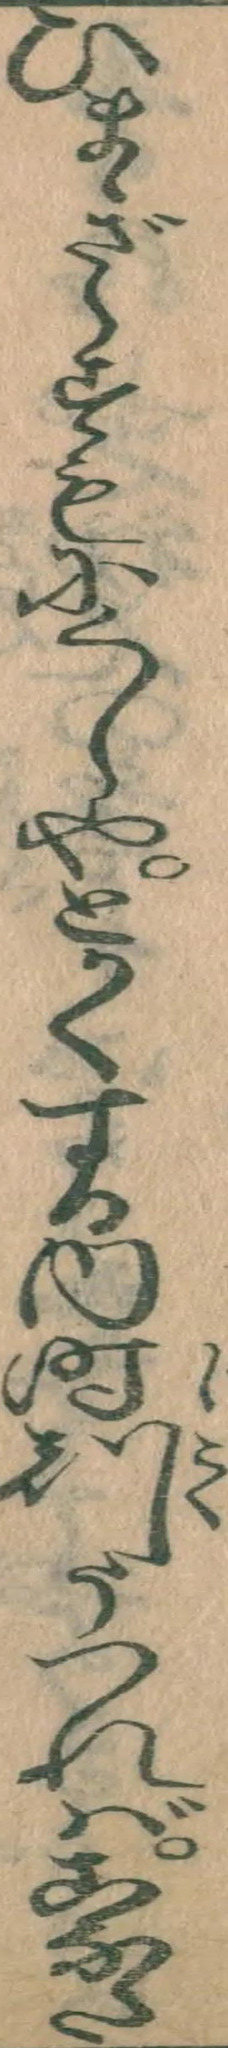ひまぎらすもにくしや。とかくする内時刻うつれば。こなた
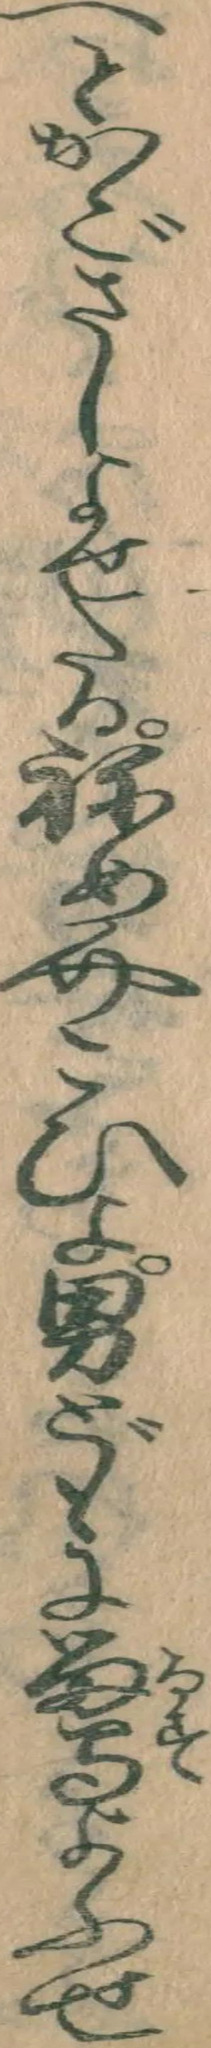へとかごさしよせたる。ねめ介こひよ。男どもに留守よふせ
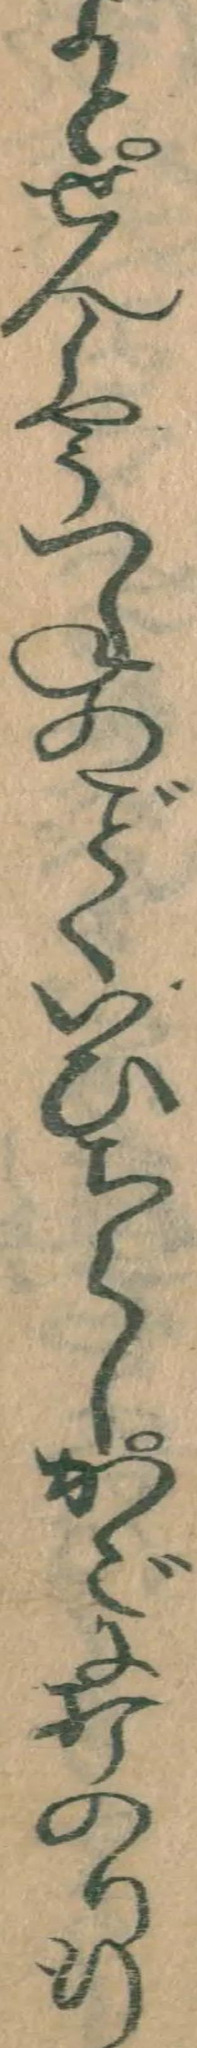よと。せんしやうつねのごとくいひちらし。かごに打のり行

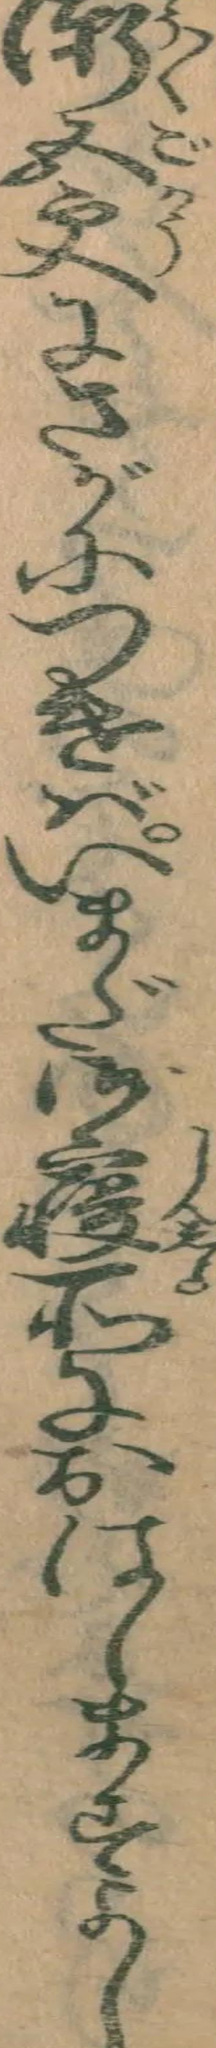漸五更にさがにつけば。いまだ御寝所におはしますよし
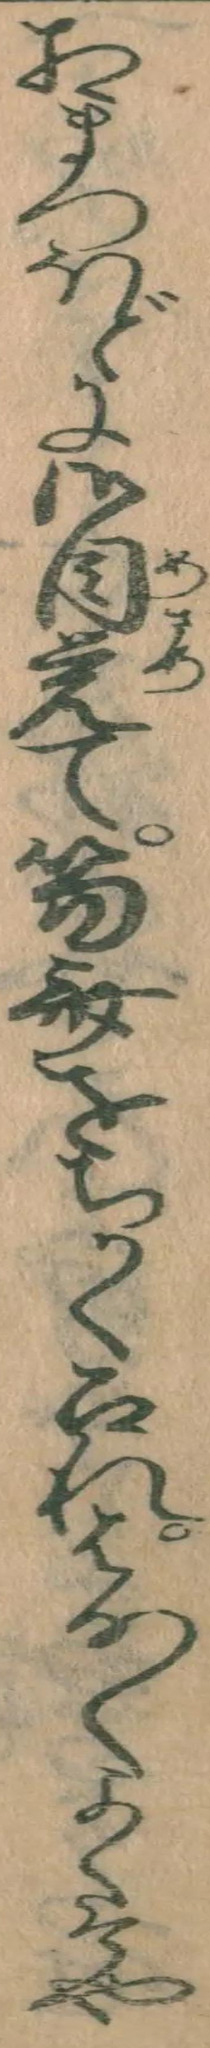相まつほどに御目覚て。筍斎をちかく召れ。はる〳〵よくそや
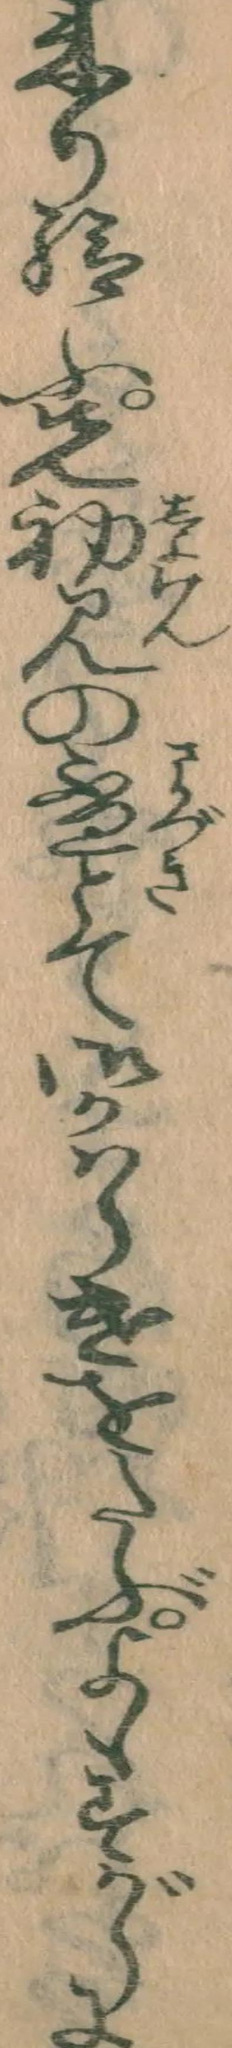来り給ふ。先初見の杯とて御かはらけをたぶ。よもすがらに
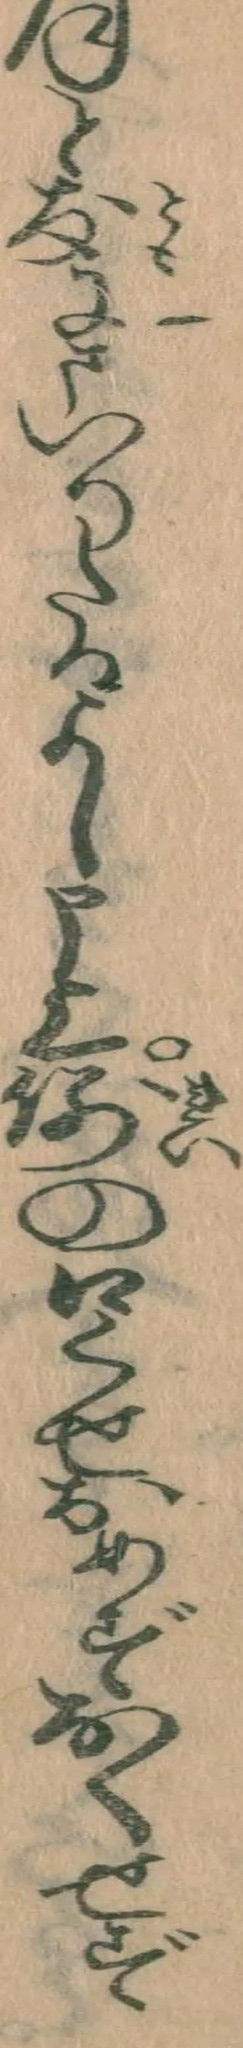月と友にまいりたるよし申上。例の口くせおめずおくせず
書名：新竹斎 5巻
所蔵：国立国会図書館 National Diet Library, JAPAN
